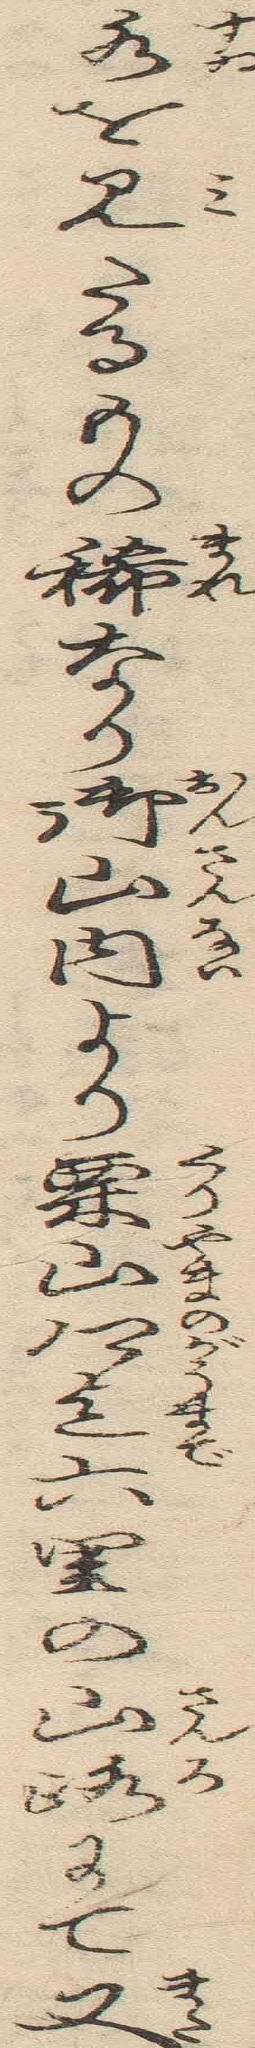水を見たるもの稀なり御山内より栗山郷迄六里の山路にて又
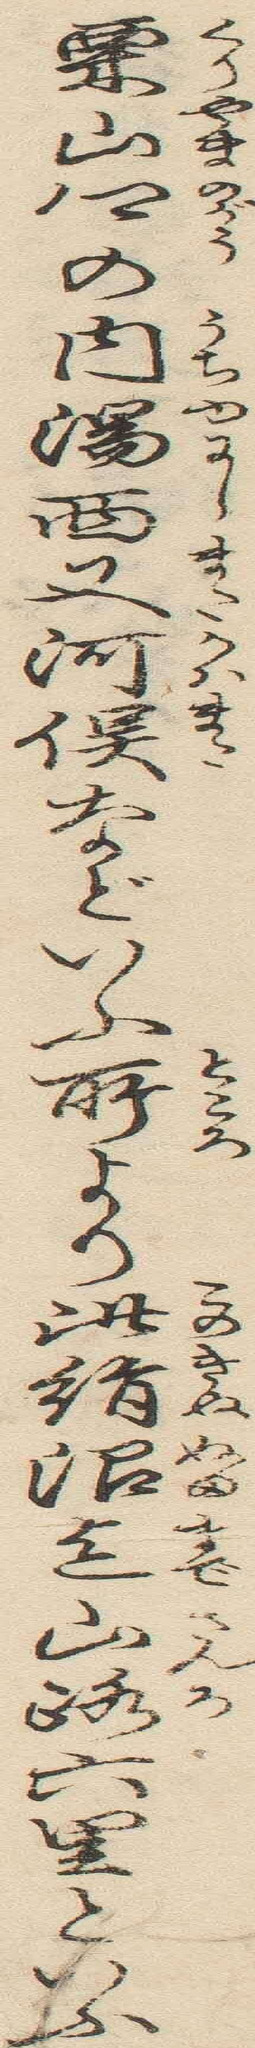栗山郷の内湯西又河俣などいふ所より此絹沼迄山路六里といふ
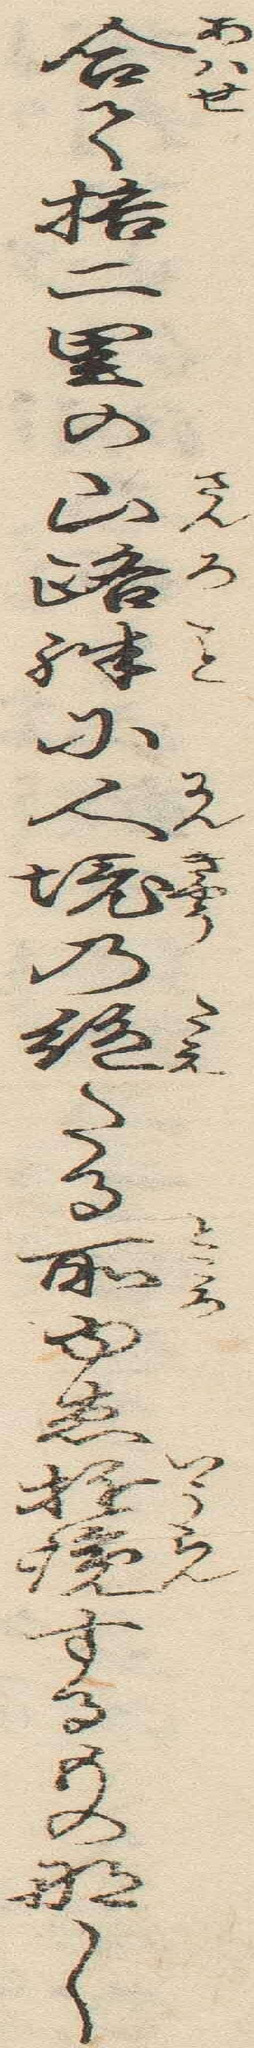合て拾二里の山路殊に人境の絶たる所ゆゑ逰覧するものなし
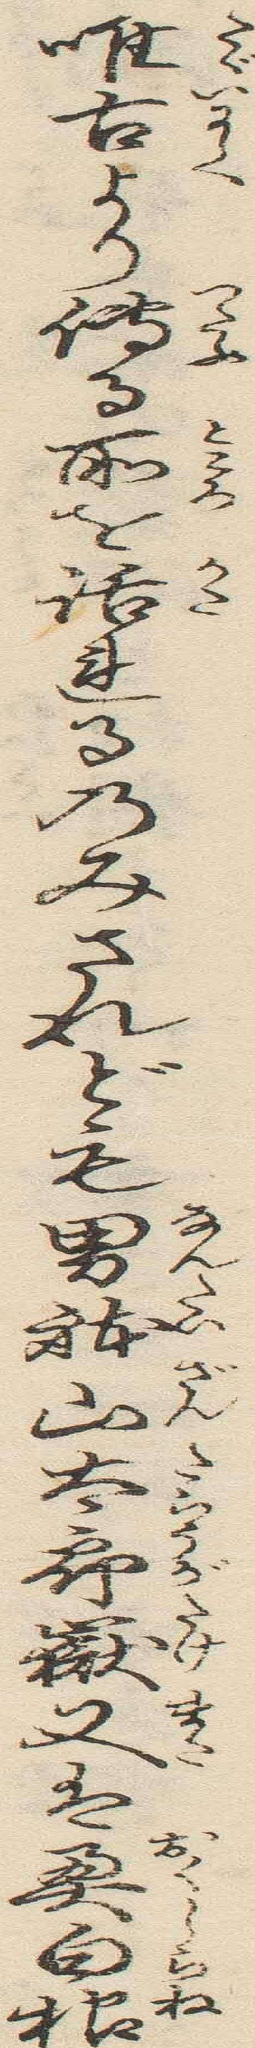唯古より傳る所を話れるのみされども男躰山太郎嶽又は奥白根
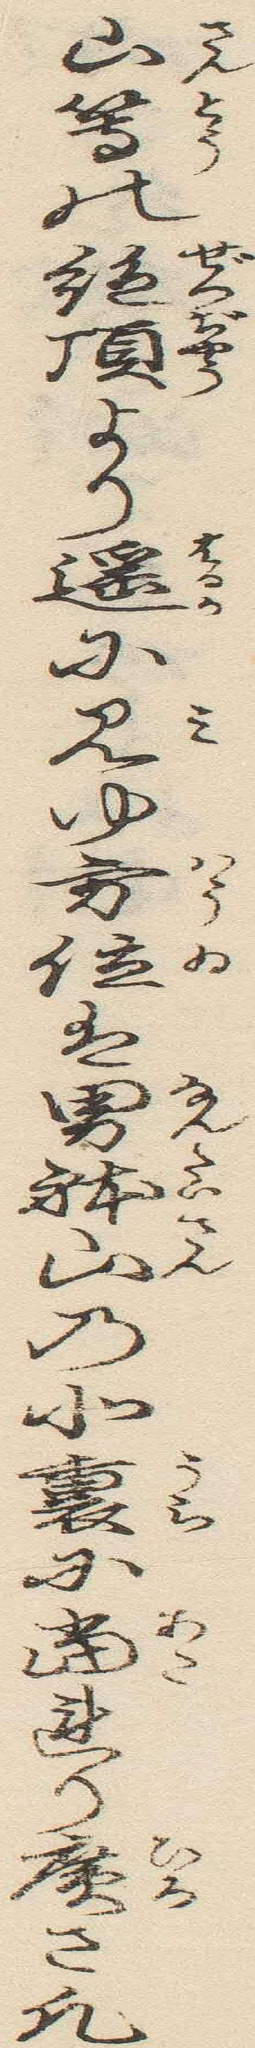山等の絶頂より遥に見ゆ方位は男躰山の北裏に當れり廣さ凢
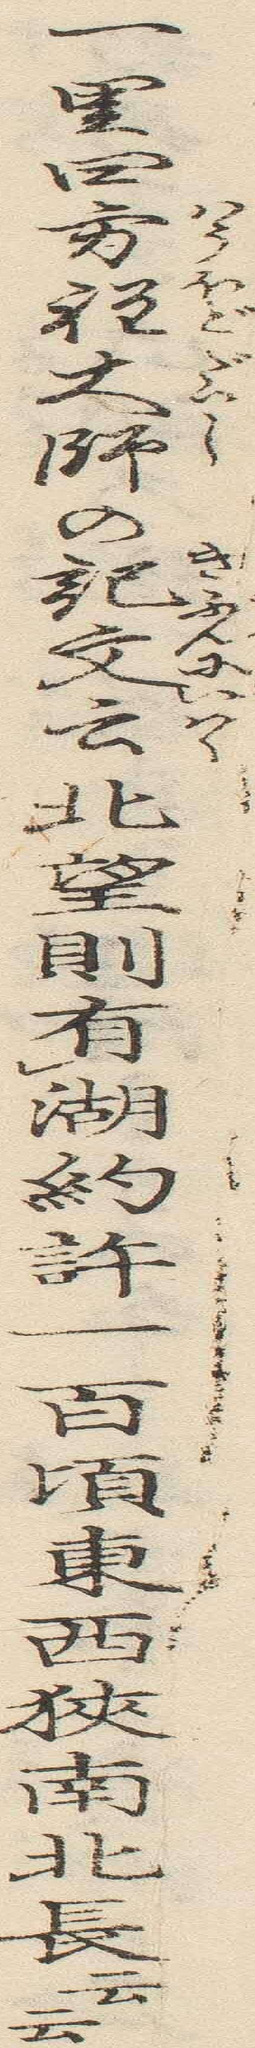一里四方程大師の起文云北望則有湖約許一百頃東西狹南北長云云
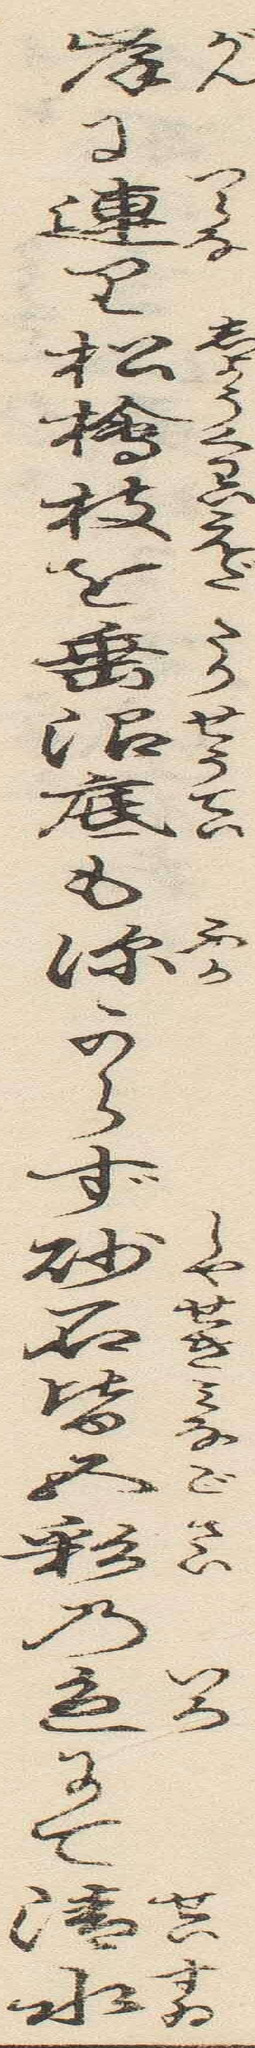岸に連り松檜枝を垂沼底も深からず砂石皆五彩の色にて清水
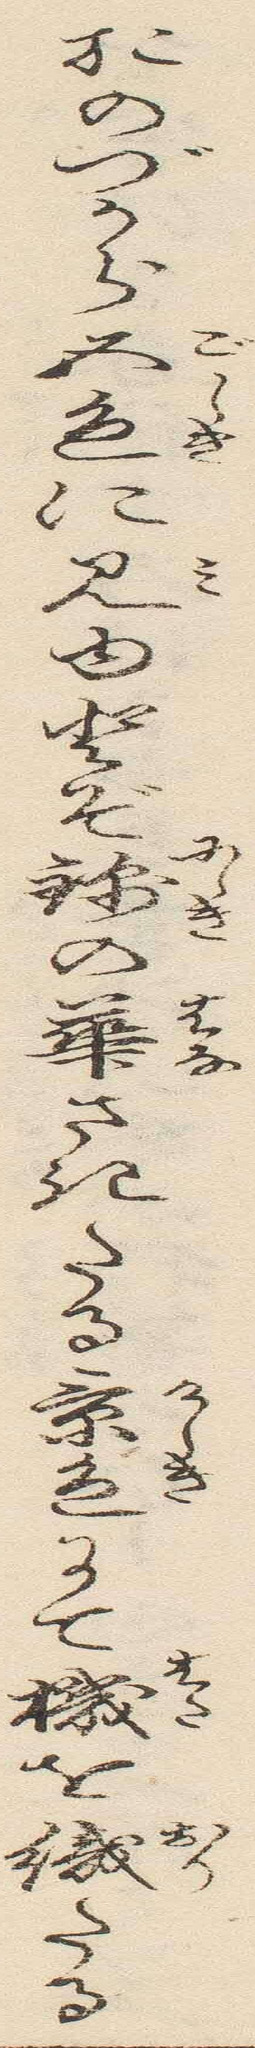おのづから五色に見ゆとぞ錦の蕐さきたる景色にて機を織たる
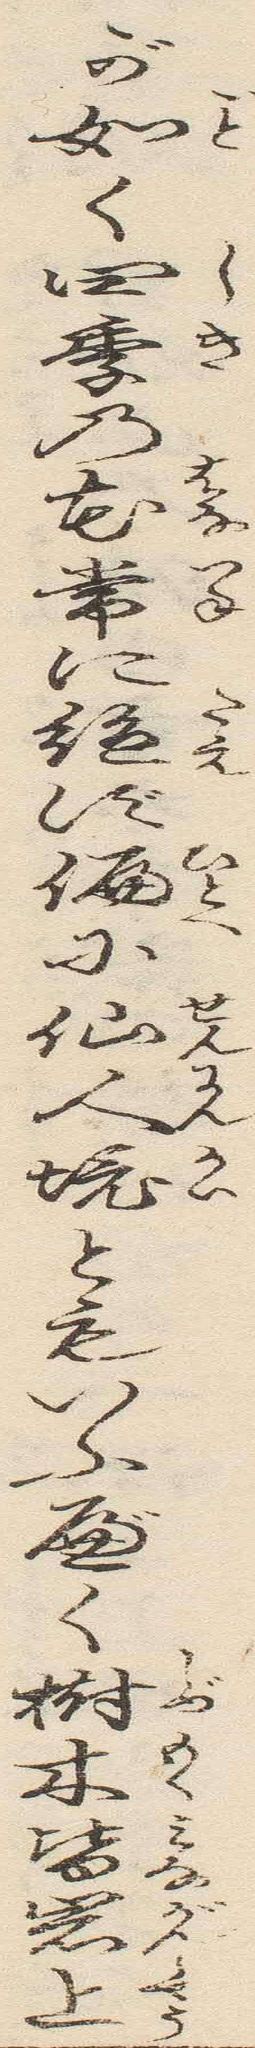が如く四季の花常に絶ず偏に仙人境ともいふべく樹木皆岩上
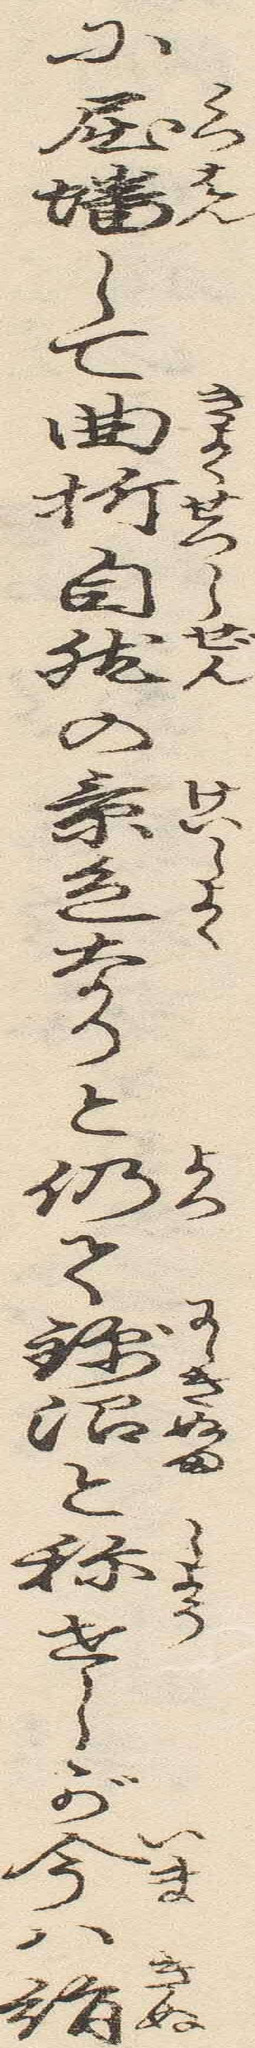に屈蟠して曲折自然の景色なりと仍て錦沼と称せしが今は絹
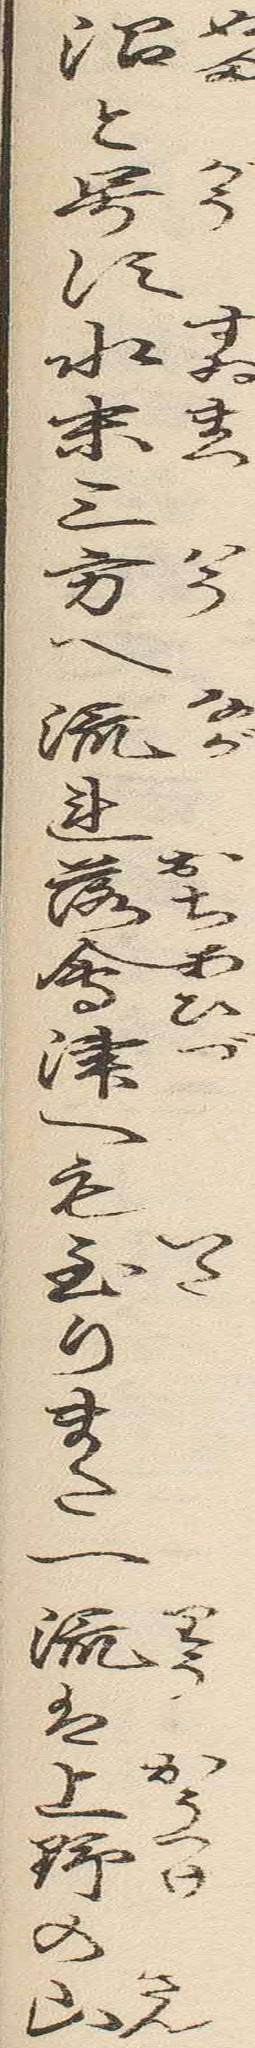沼と号す水末三方へ流れ落會津へも至りまた一流は上野の山
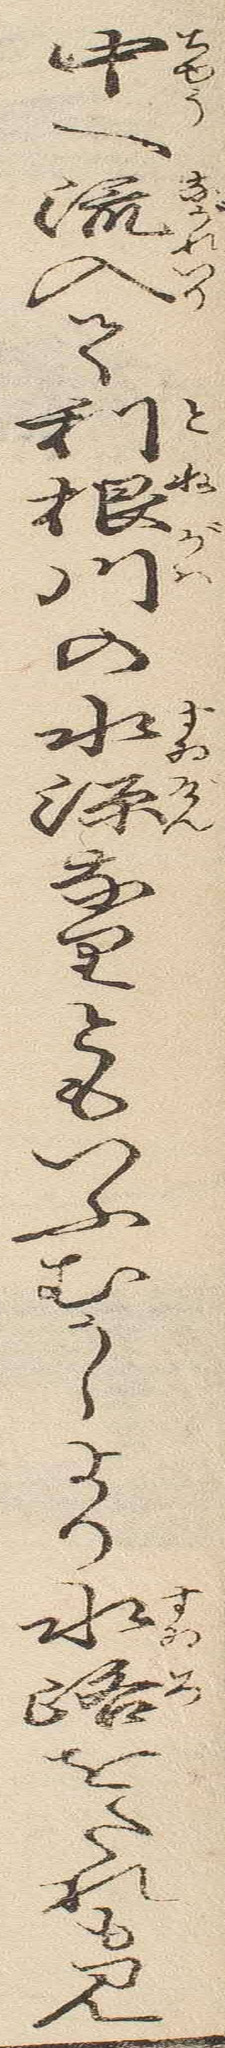中へ流入て利根川の水源なりともいふむかしより水路をたれも見
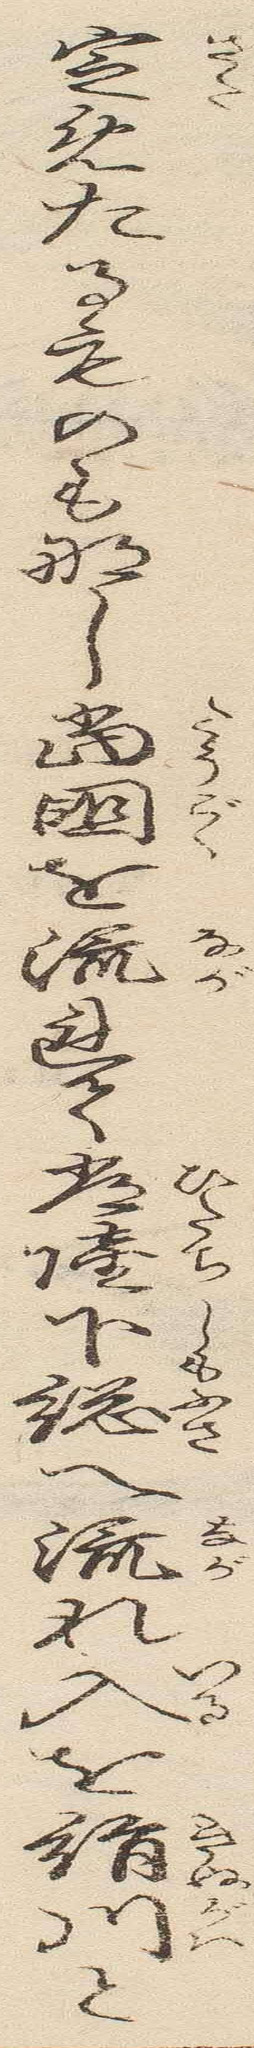定めたるものもなし當國を流れて常陸下総へ流れ入を絹川と
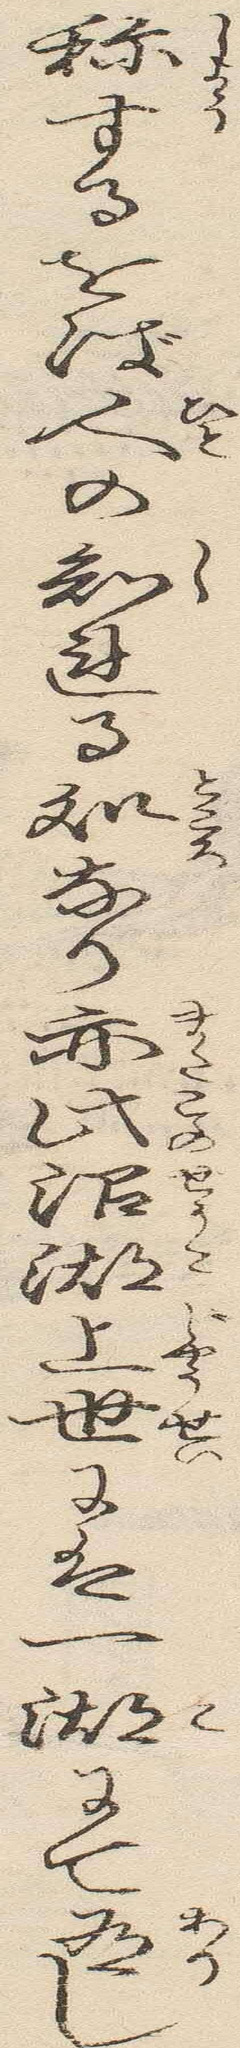称するをば人の知れる処なり亦此沼湖上世には一湖にて有し
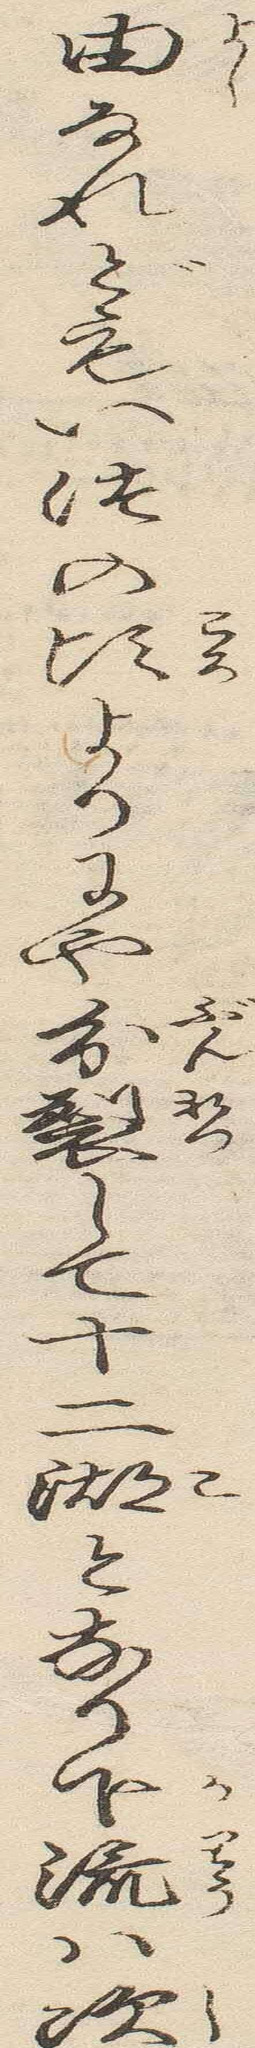由なれどもいつの頃よりにや分裂して十二湖となり下流は次
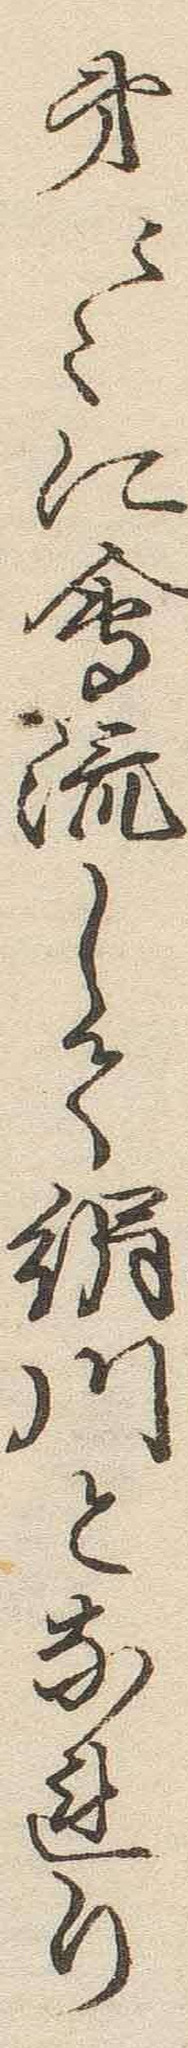㐧〻〻に會流して絹川となれり
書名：日光山志
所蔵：東京学芸大学附属図書館 国文学研究資料館
